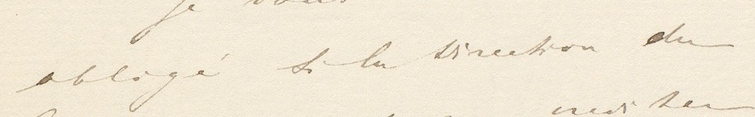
obligé si la Direction du
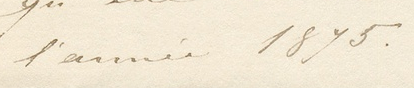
l'année 1875.
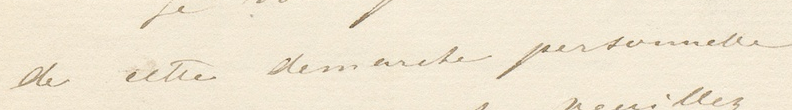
de cette demarche personnelle
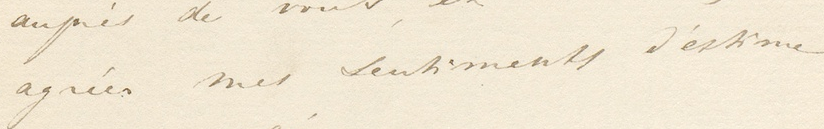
agréer mes sentiments d'estime
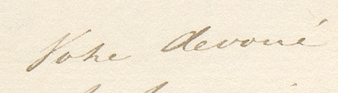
Votre devoué
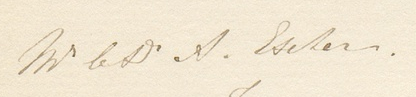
Mr le Dr A. Escher.
